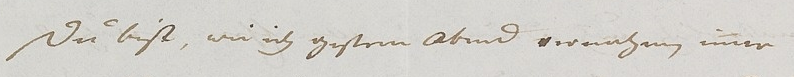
Du bist, wie ich gestern Abend vernahm, immer
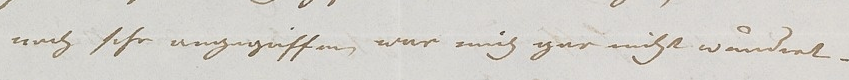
noch sehr angegriffen, was mich gar nicht wundert. –
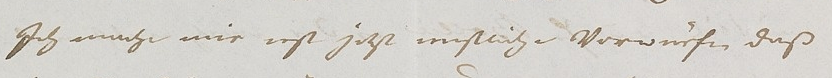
Ich mache mir erst jetzt ernstliche Vorwürfe, daß
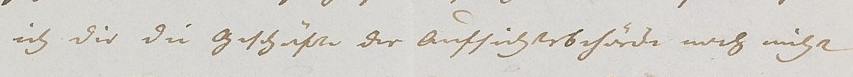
ich dir die Geschäfte der Aufsichtsbehörde noch nicht
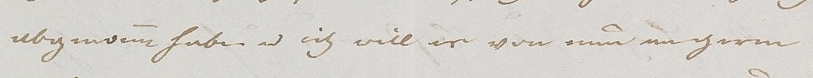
abgenommen habe u ich will es von nun an gerne
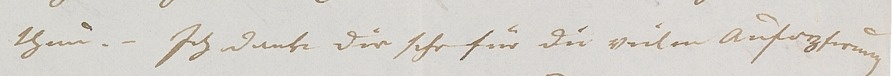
thun. – Ich danke dir sehr für die vielen Aufopferungen
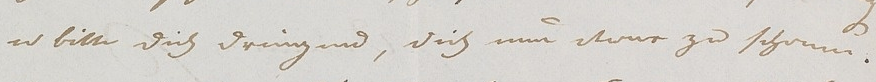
u bitte dich dringend, dich nun etwas zu schonen.
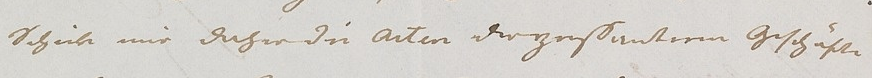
Schicke mir daher die Acten der pressanteren Geschäfte
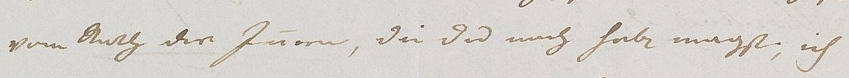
vom Rath des Innern, die du noch haben magst; ich
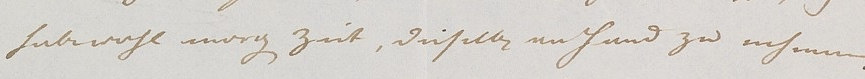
habe wohl morgen Zeit, dieselben an Hand zu nehmen. –
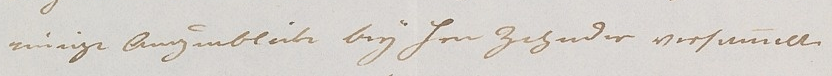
einige Augenblicke bey Hrn Zehnder versammelt.
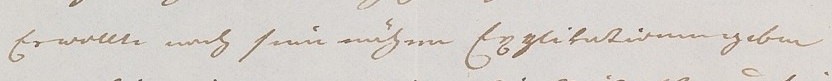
Er wollte noch seine nähern Explikationen geben
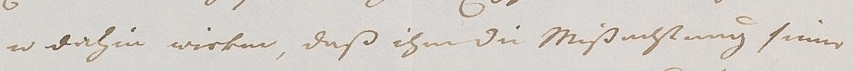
u dahin wirken, daß ihm die Mißachtung seiner
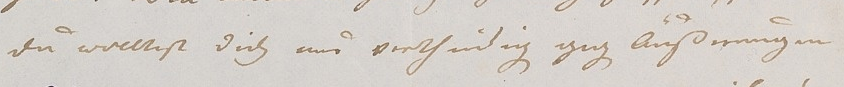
du wolltest dich nur vertheidigen gegen Äußerungen
